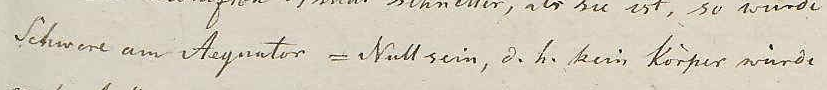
Schwere am Aequator Null sein, d. h. kein Körper würde
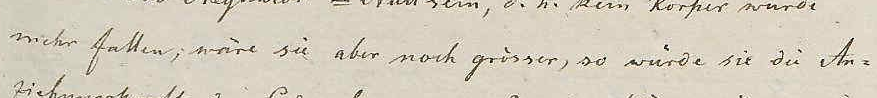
mehr fallen; wäre sie aber noch grösser, so würde sie die An-
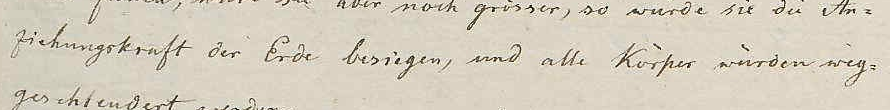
ziehungskraft der Erde besiegen, und alle Körper würden weg-
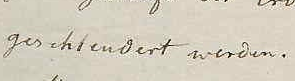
geschleudert werden.
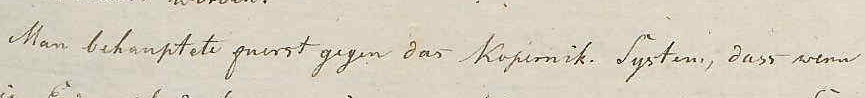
Man behauptete zuerst gegen das Kopernik. System, dass wenn
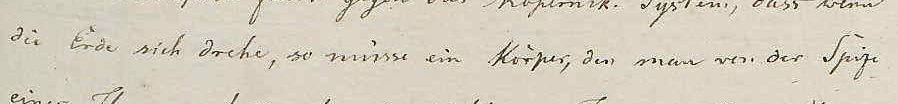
die Erde sich drehe, so müsse ein Körper, den man von der Spize
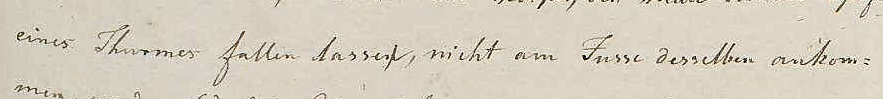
eines Thurmes fallen lassen, nicht am Fusse desselben ankom-
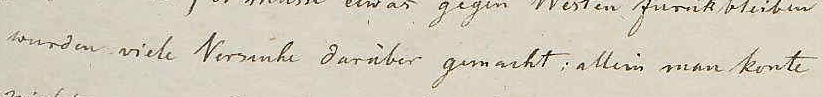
wurden viele Versuche darüber gemacht: allein man konte
